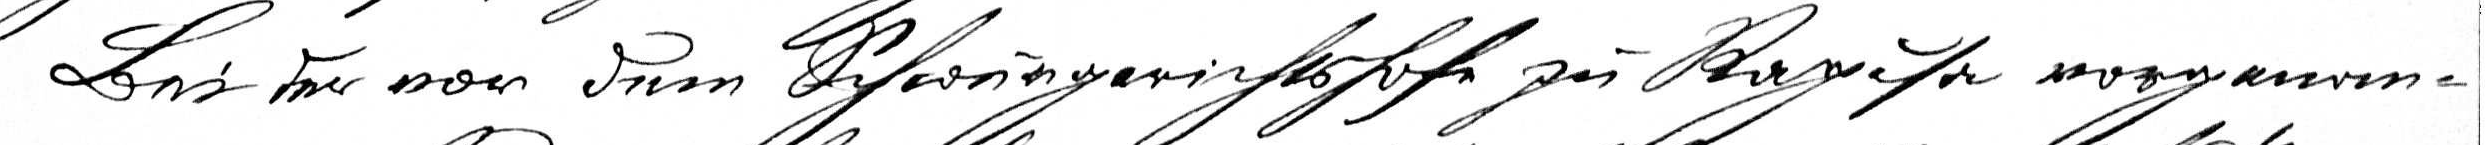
Bei der vor dem Schwurgerichtshofe zu Ragusa vorgenom¬
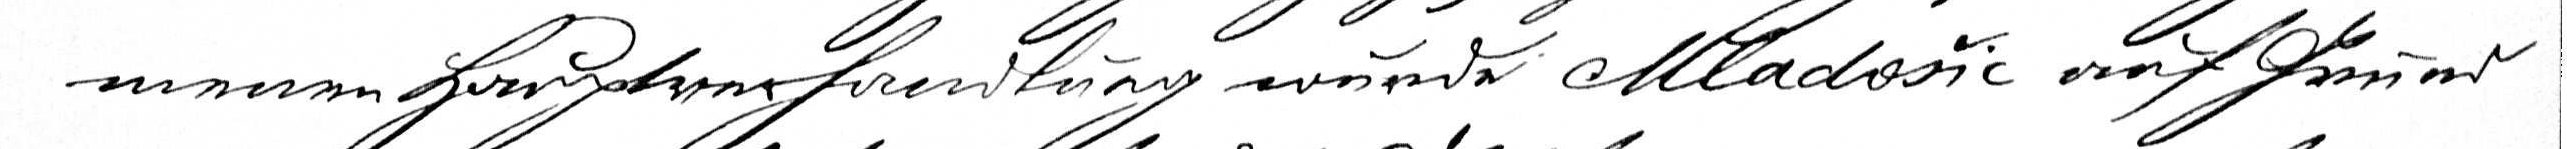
menen Hauptverhandlugn wurde Mladošić auf Grund
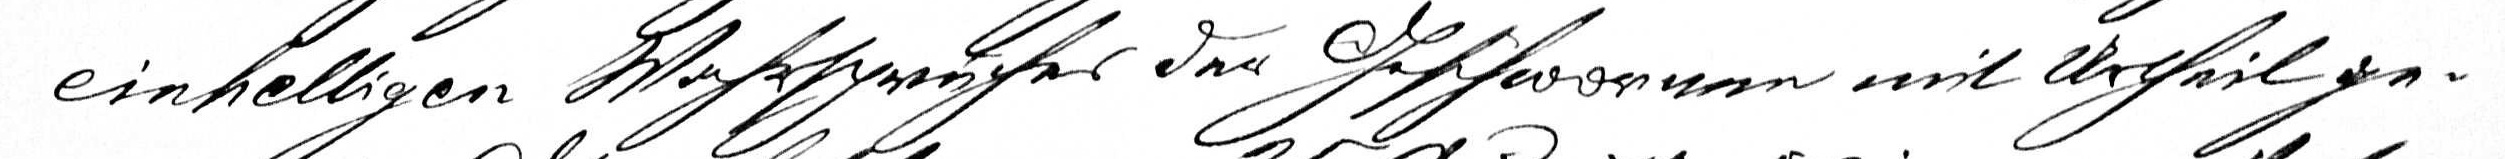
einhelligen Wahrspruches der Geschworene mit Urtheil ge¬
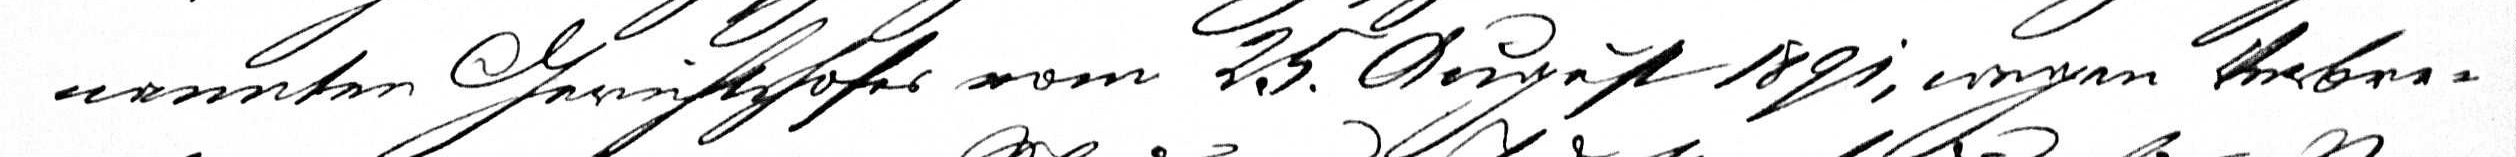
nannten Gerichtshofes vom 25. August 1891, wegen Verbre¬
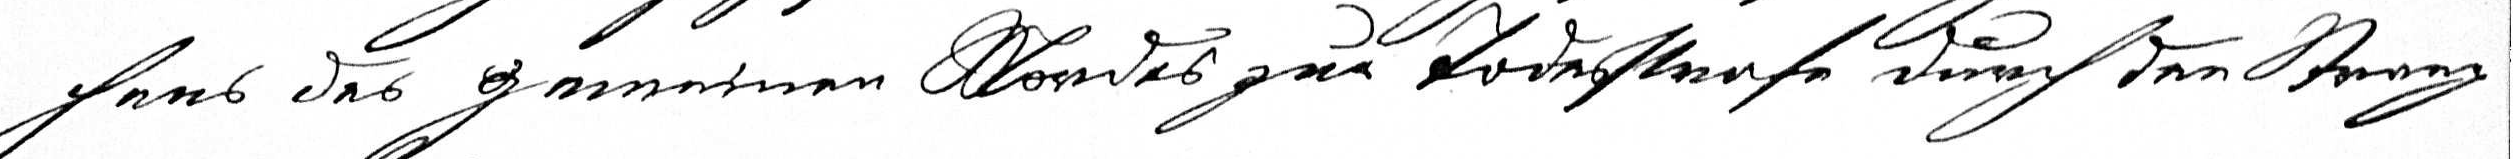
chens des gemeinen Mordes zur Todesstrafe durch den Strang
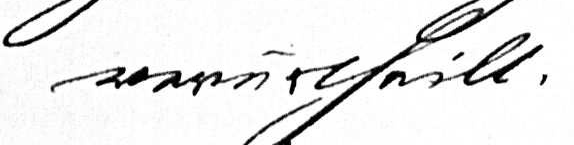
verurtheilt.
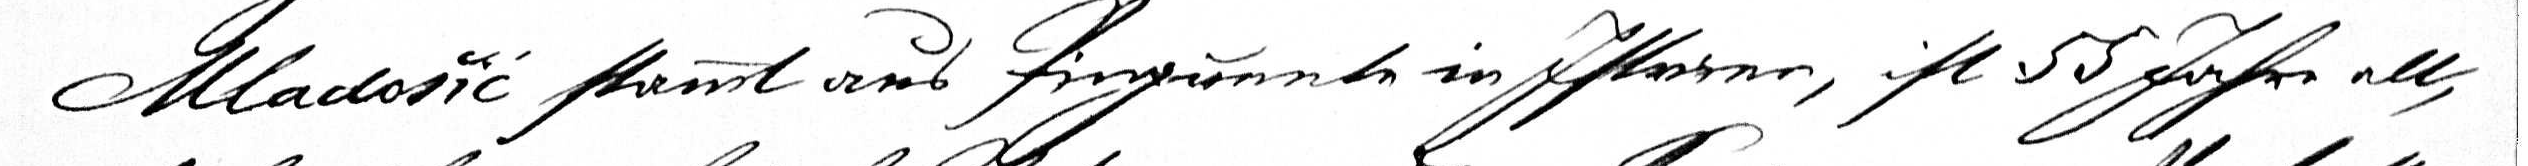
Mladošić stammt aus Pinguente in Istrien, ist 55 Jahre alt,
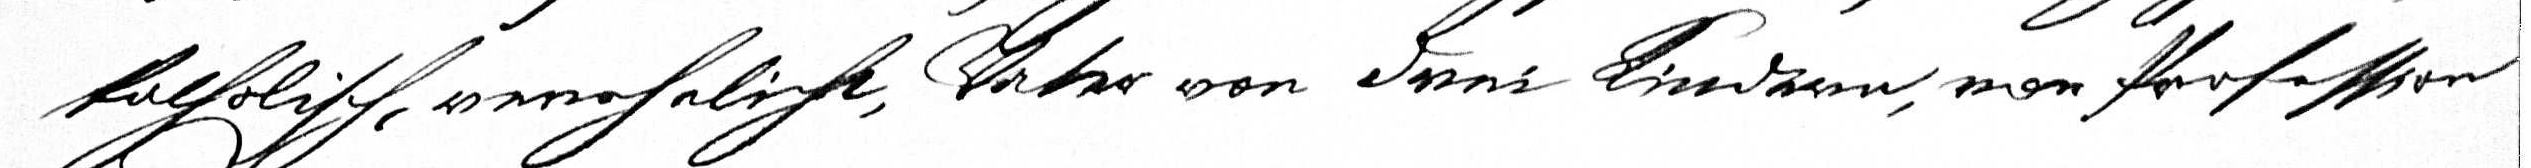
katholisch, verehelicht, Vater von drei Kindern, von Profession
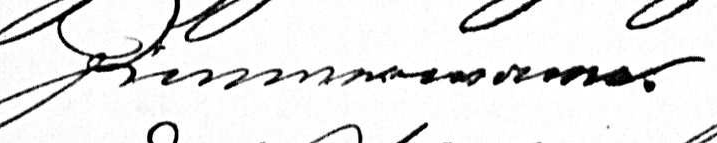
Zimmermann.
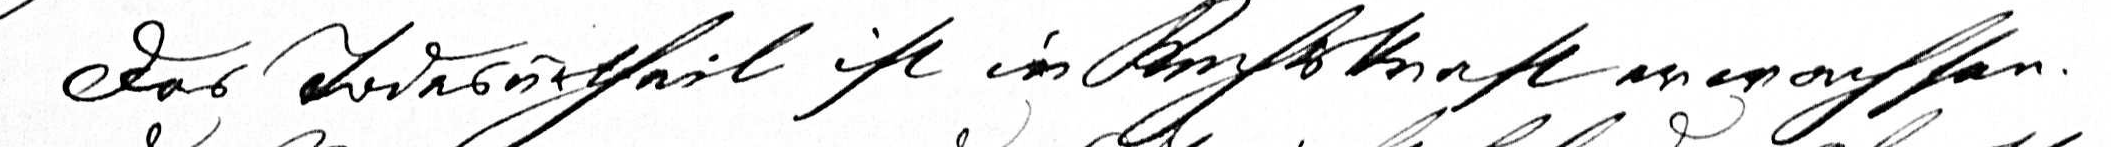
Das Todesurtheil ist in Rechtskraft erwachsen.
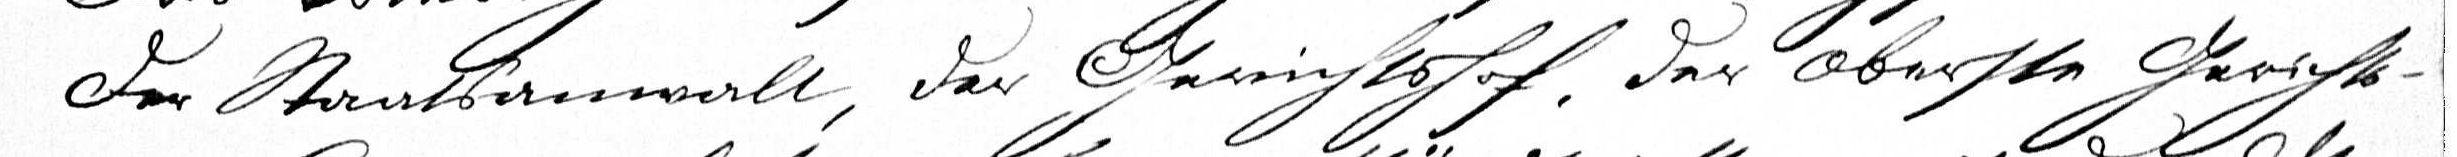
Der Staatsanwalt, der Gerichtshof, der oberste Gerichts¬
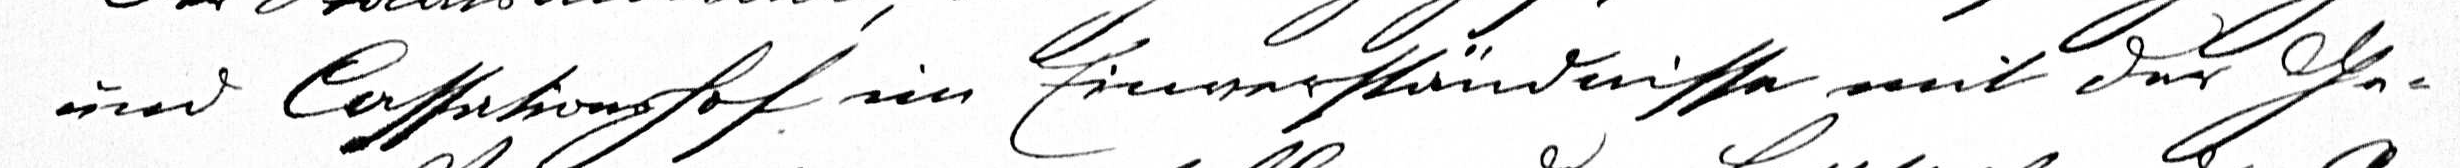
und Cassationshof im Einverständnisse mit der Ge¬
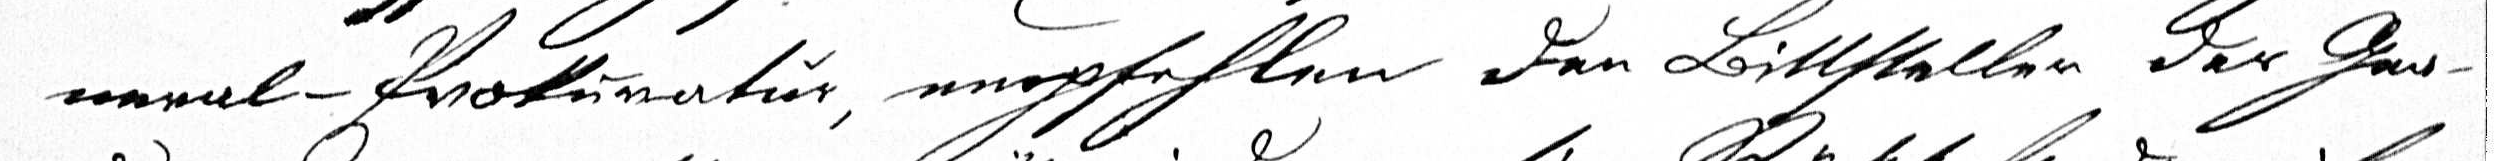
neral-Prokuratur, empfehlen den Bittsteller der Gna¬
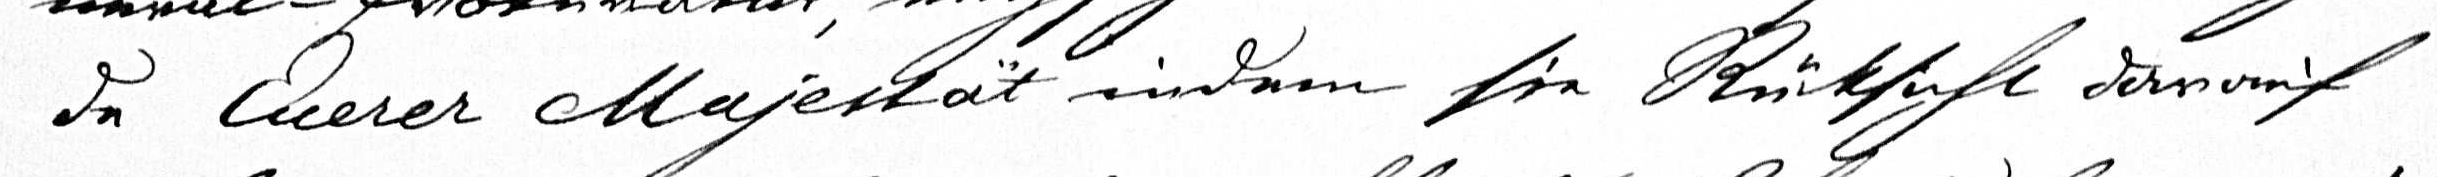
de Euerer Majestät indem sie Rücksicht darauf
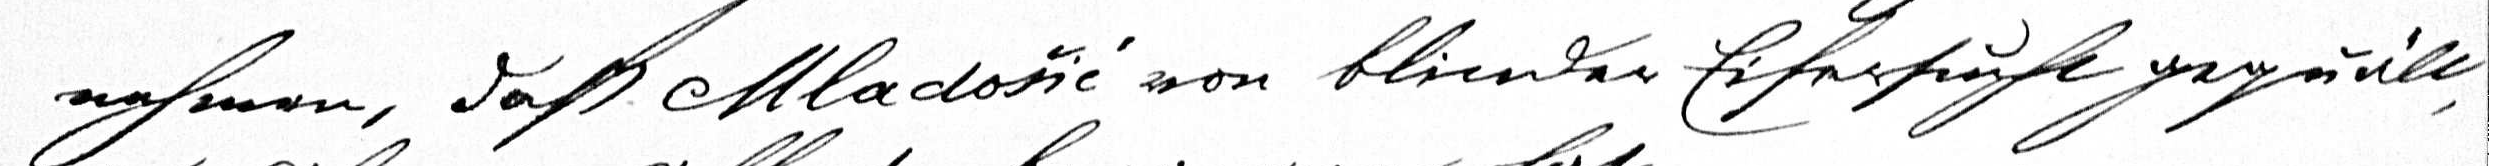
nehmen, daß Mladošić von blinder Eifersucht gequält,
